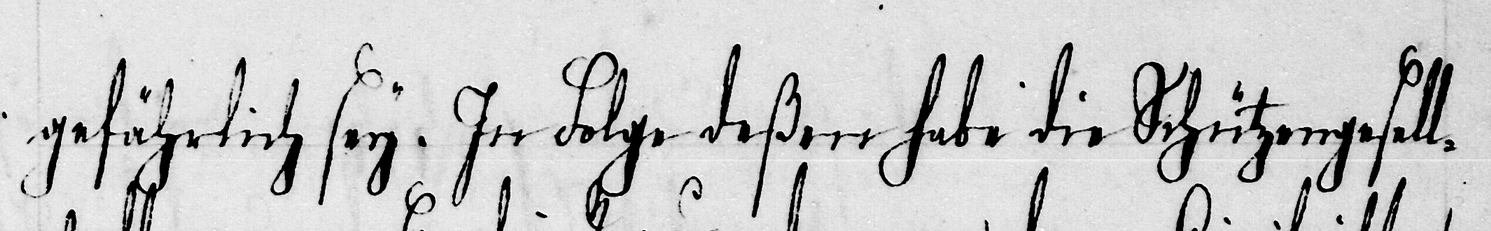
fährlich sey. In Folge deßen habe die Schützenges¬
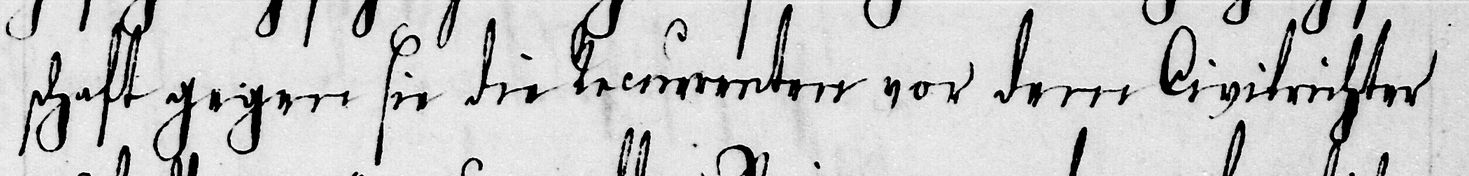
schaft gegen sie die Recurrenten vor dem Civilrichter
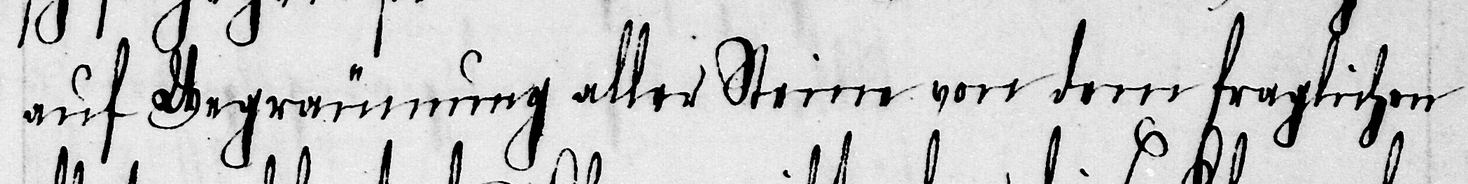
auf Wegräumung aller Steine von dem fraglichen
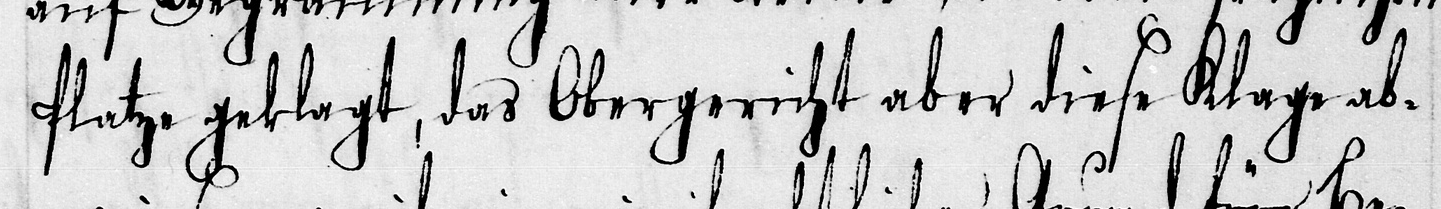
Platze geklagt, das Obergericht aber diese Klage ab¬
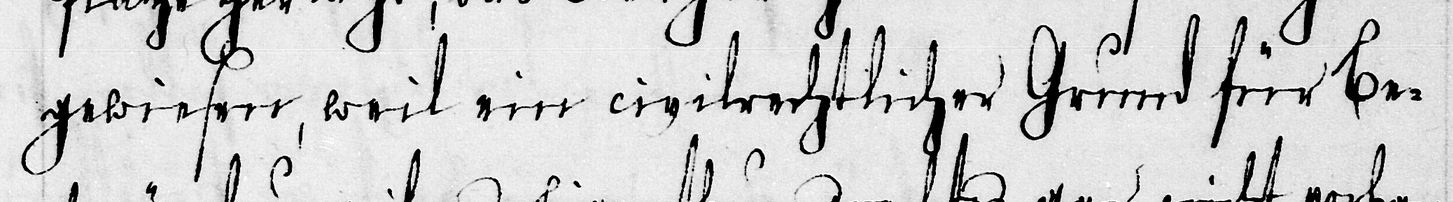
gewiesen, weil ein civilrechtlicher Grund für Be¬
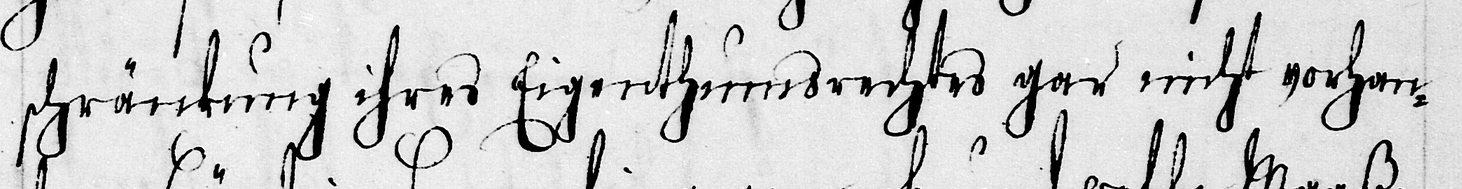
schränkung ihres Eigenthumsrechtes gar nicht vorhan¬
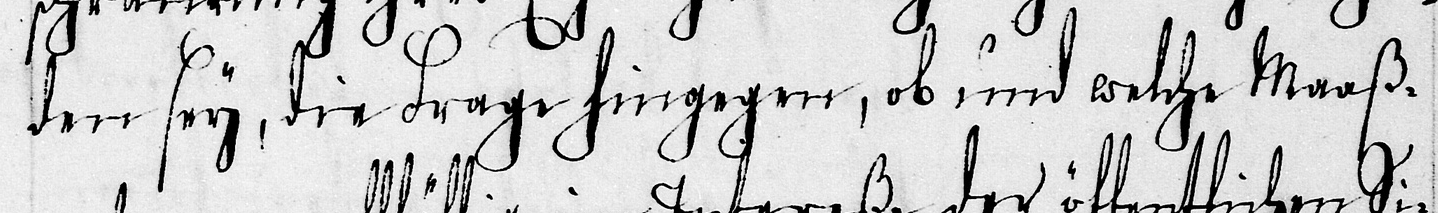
den sey, die Frage hingegen, ob und welche Maaß¬
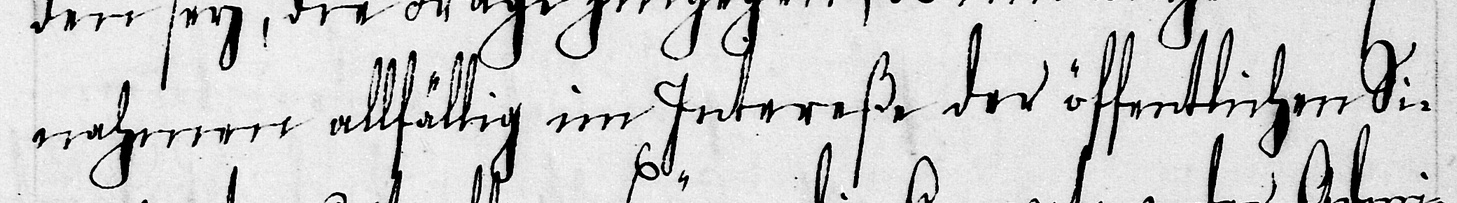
nahmen allfällig im Intereße der öffentlichen Si¬
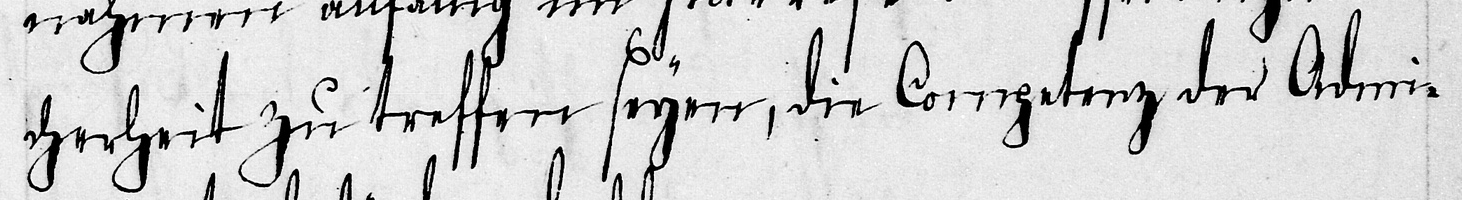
cherheit zu treffen seyen, die Competenz der Admi¬
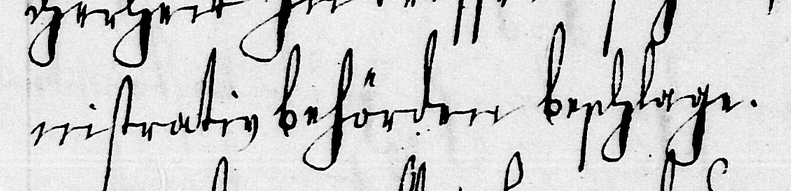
nistrativbehörden beschlage.
